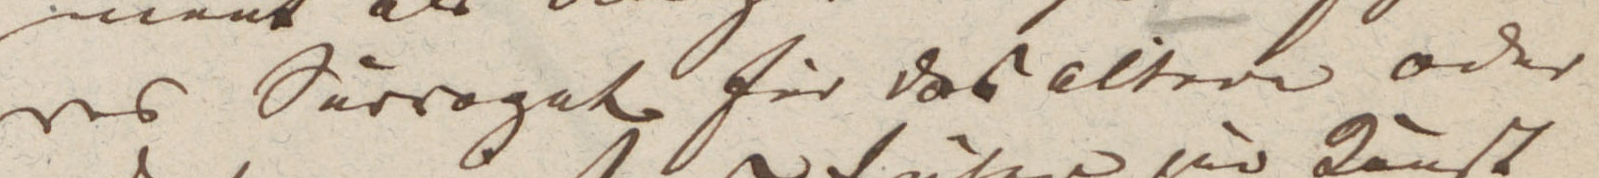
res Surrogat für das ältere oder
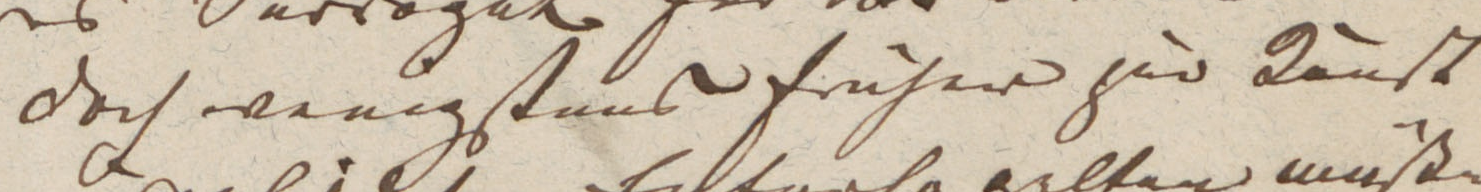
doch wenigstens früher zur Kunst
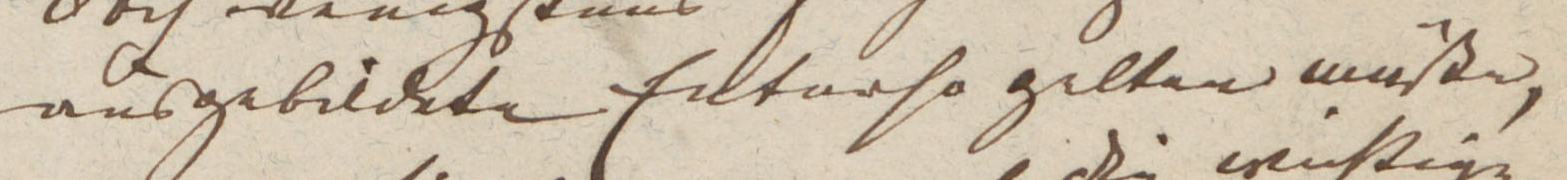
ausgebildete Entarso gelten müsse,
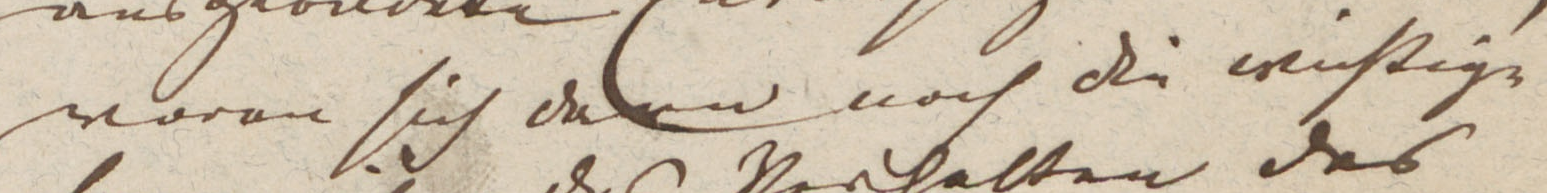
woran sich dann noch die wichtige
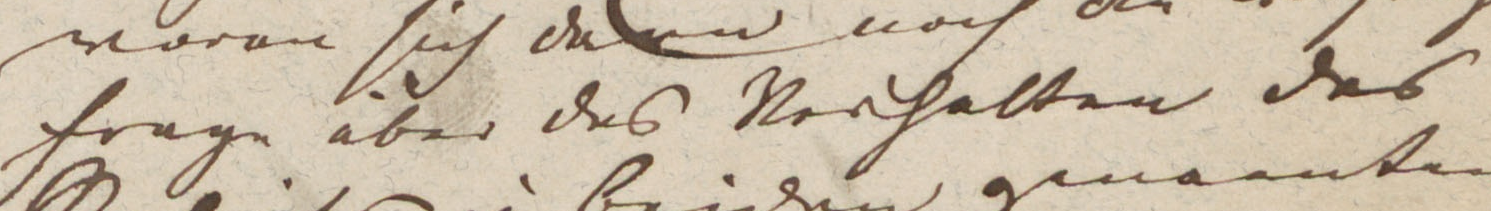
Frage über das Verhalten des
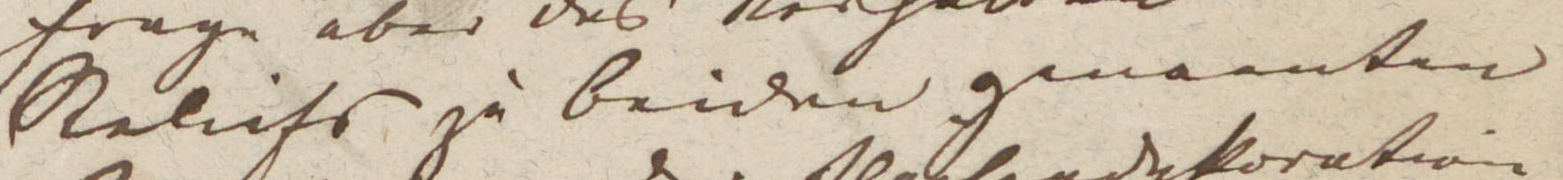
Reliefs zu beiden genannten
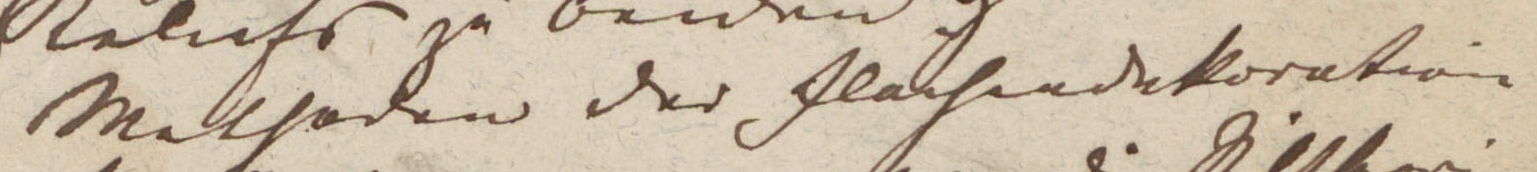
Methoden der Flächendekoration
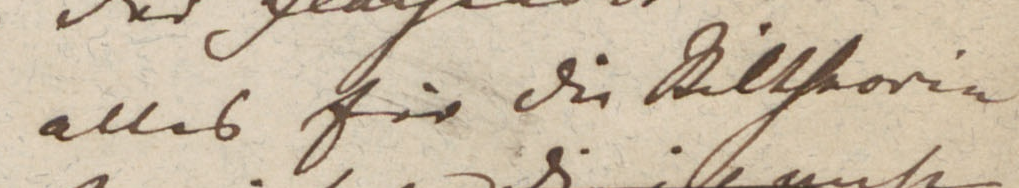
alles für die Stiltheorie
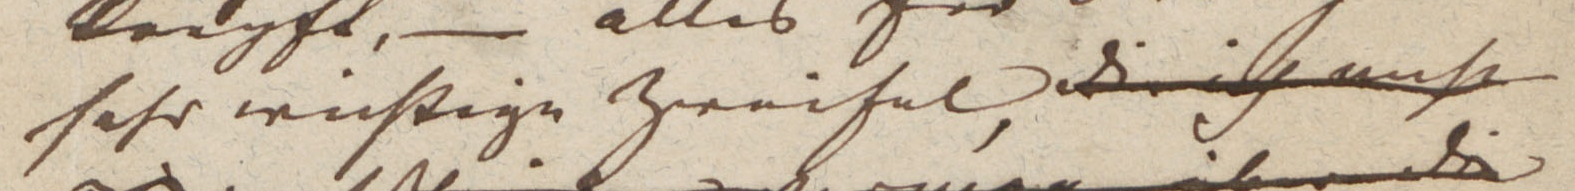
sehr wichtige Zweifel, die ich nicht
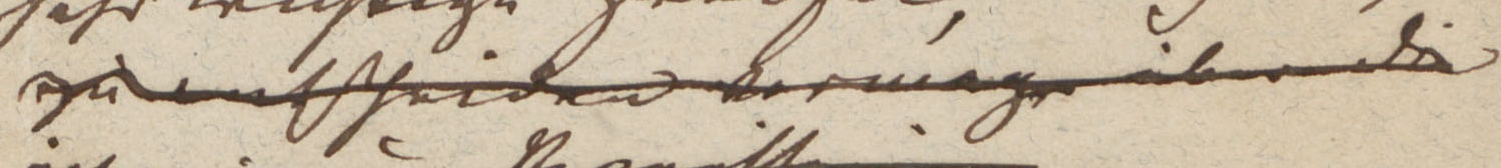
zu entscheiden vermag, über die
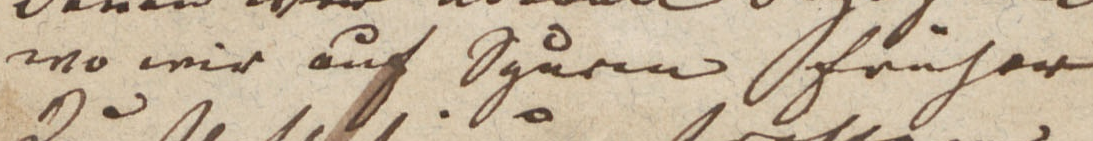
wo wir auf Spuren früher
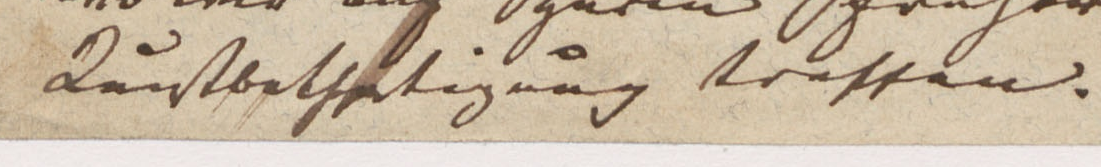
Kunstbethatigung treffen
